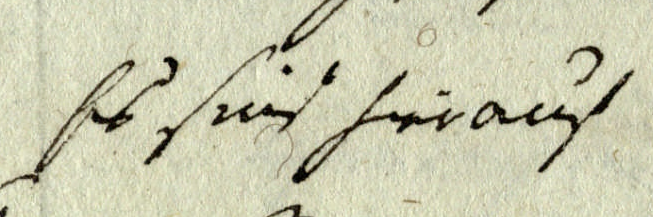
Es sind hierauf
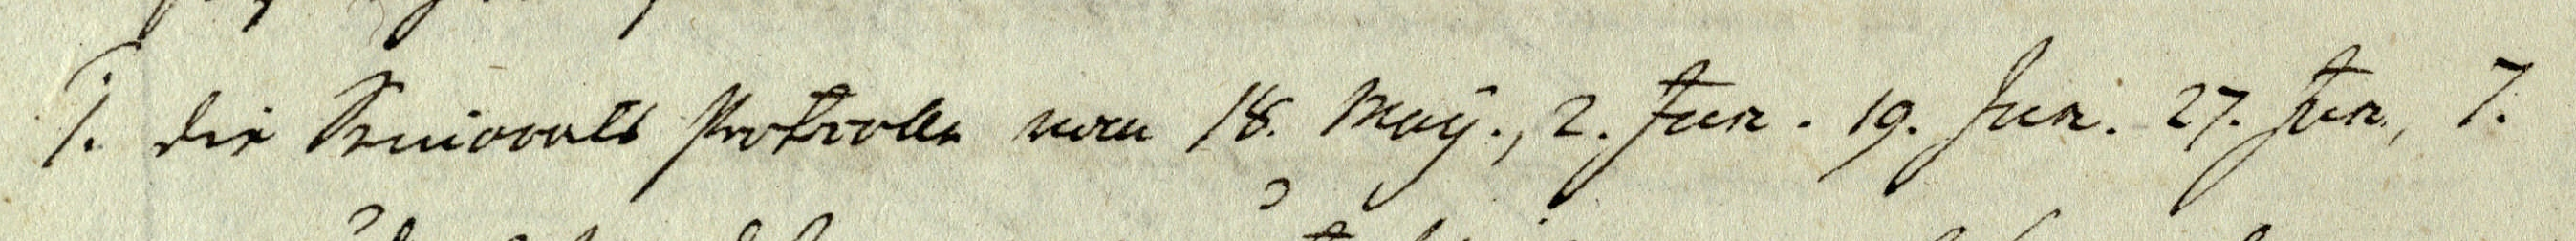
1. die Seniorats Protocolle vom 18. Maÿ., 2. Jun. 19. Jun. 27. Jun, 7.
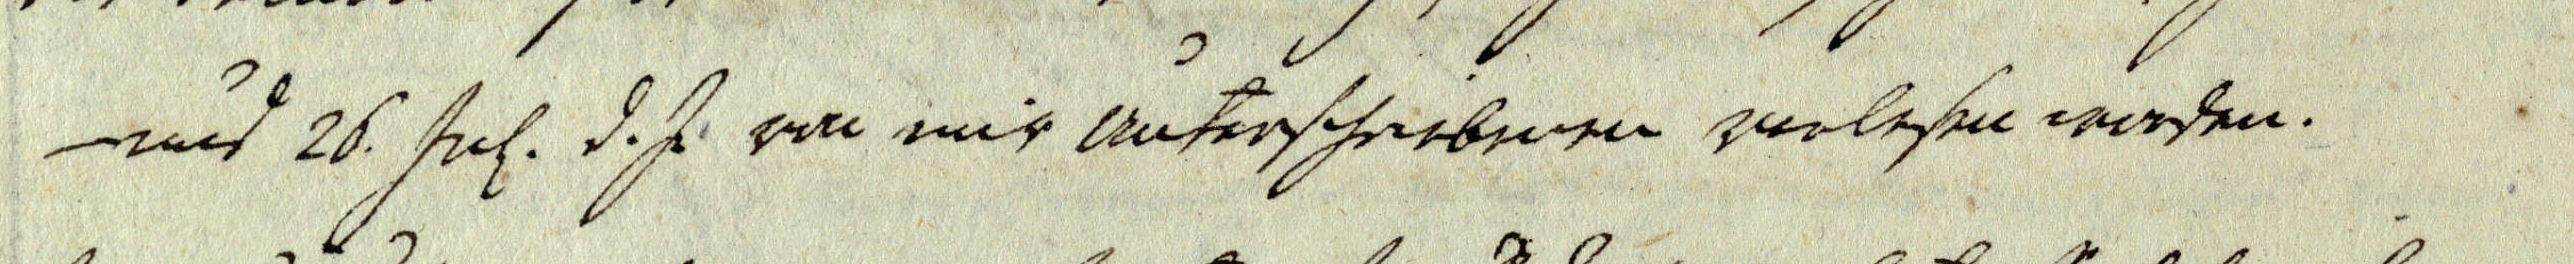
und 26. Jul. d. J. von mir Unterschriebenen vorlesen worden.
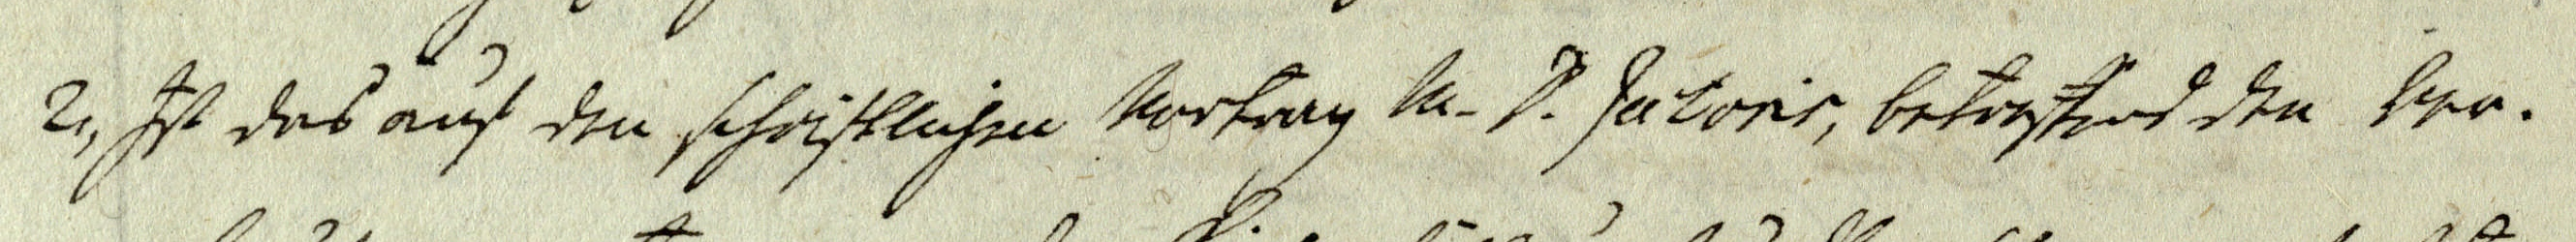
2., Ist das auf den schriftlichen Vortrag M. D. Rectoris, betreffend den Ver¬
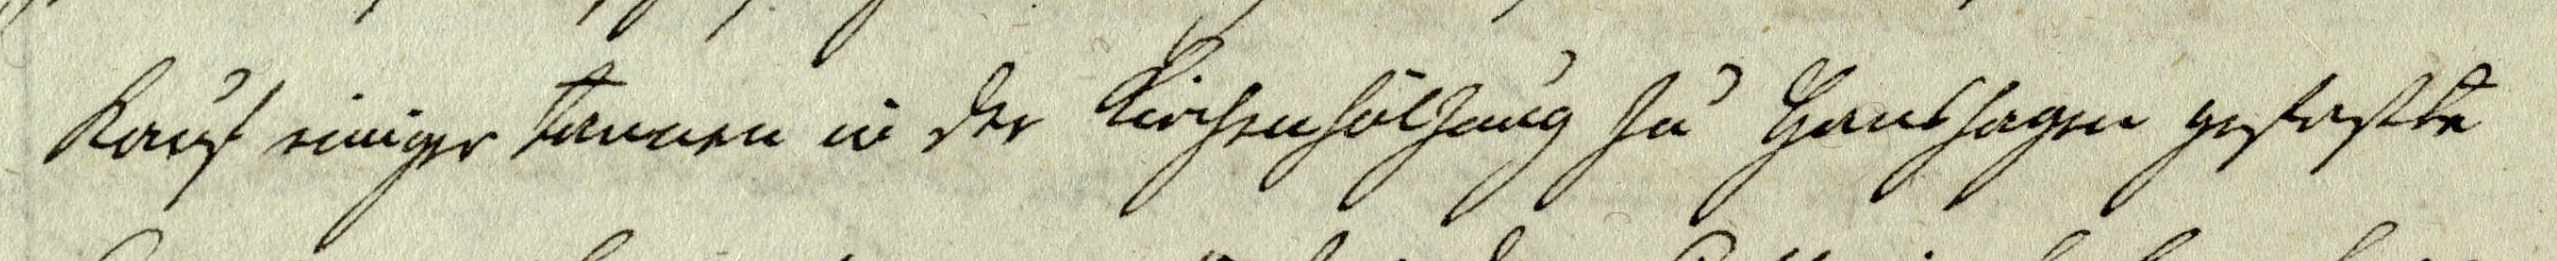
Kauf einiger Tannen in der Kirchenhölzung zu Hanshagen gefaßte
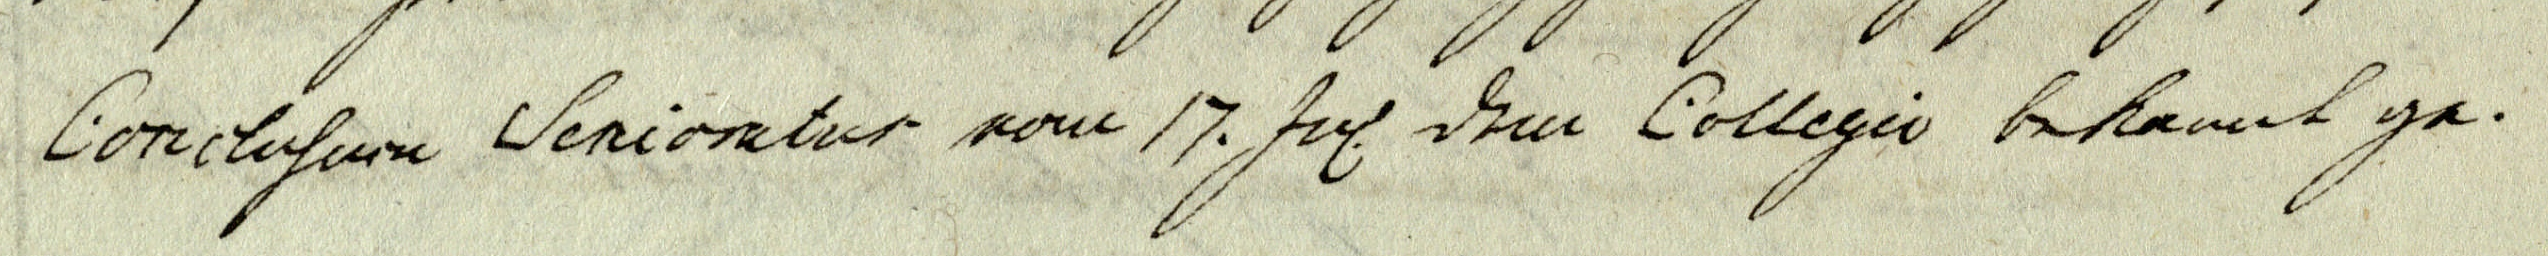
Conclusum Senioratus vom 17. Jul. dem Collegio bekannt ge¬
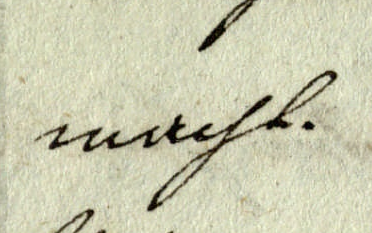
macht.
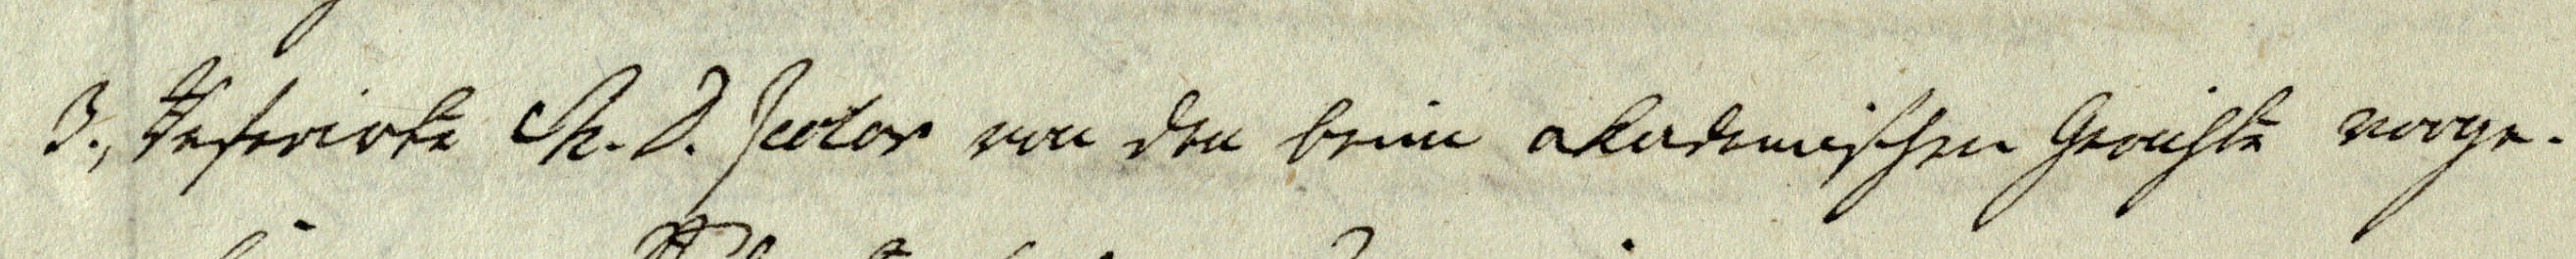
3., Referirte M. D. Rector von den beim akademischen Gerichte vorge¬
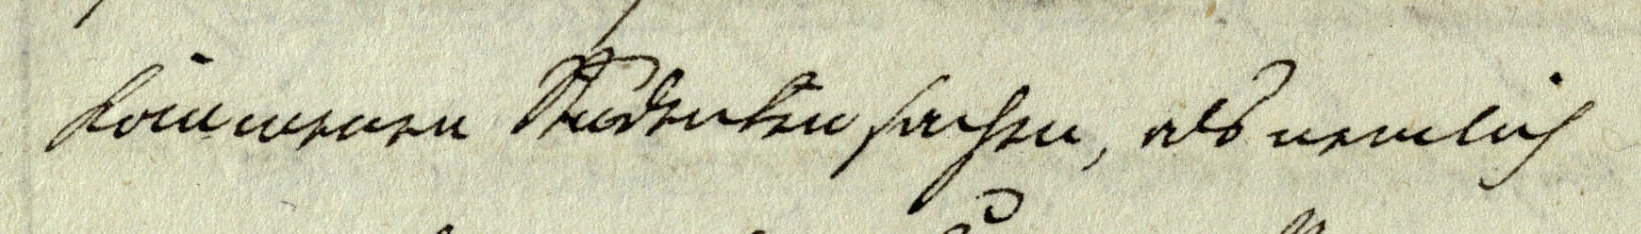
kommenen Studentensachen, als nemlich
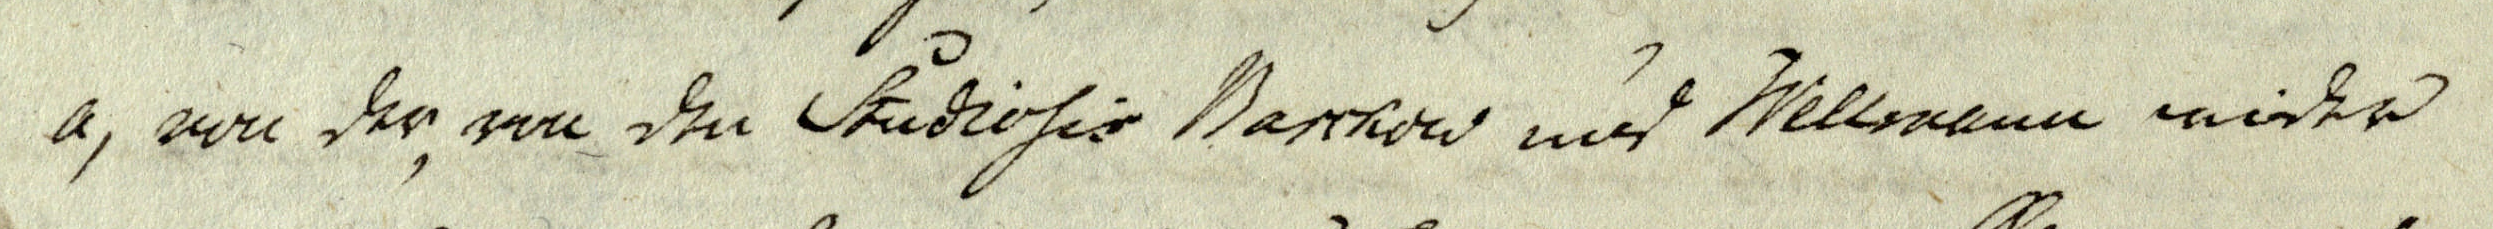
a, von der, von den Studiosis Barckow und Wellmann wider
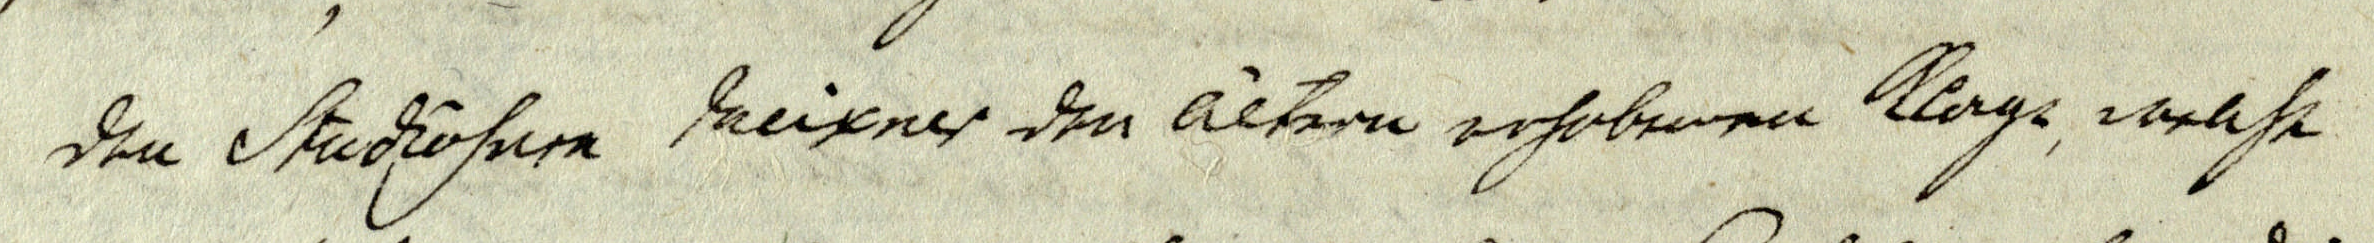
den Studiosum Meixner den ältern erhobenen Klage, welche
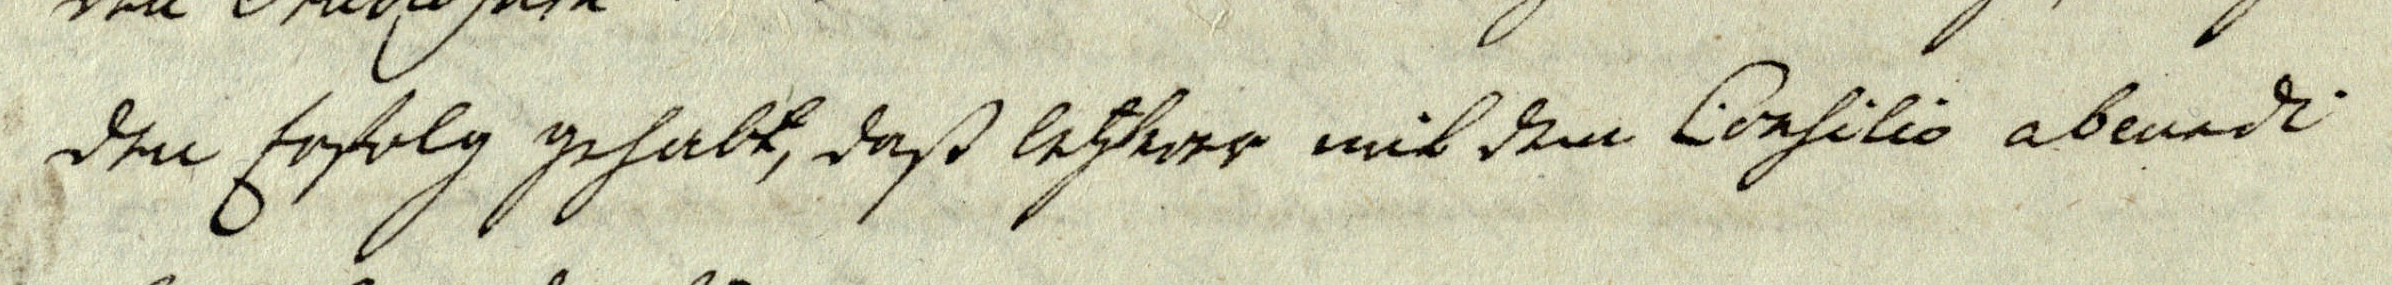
den Erfolg gehabt, daß letzterer mit dem Consilio abeundi
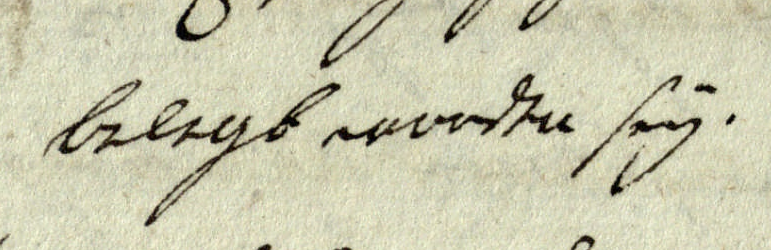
belegt worden seÿ.
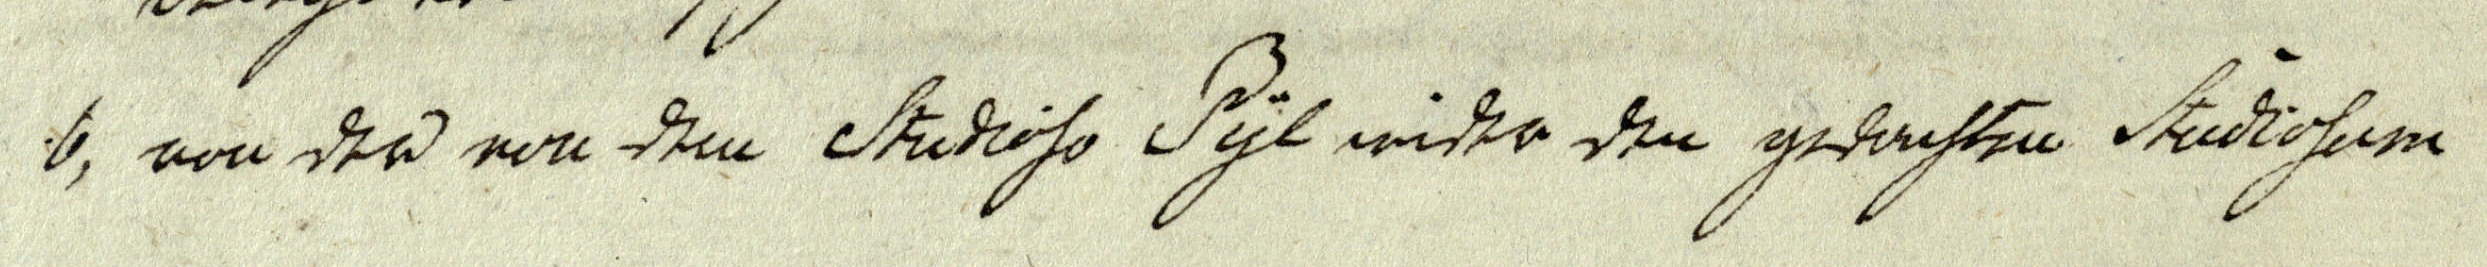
b, von der von dem Studioso Pÿl wider den gedachten Studiosum
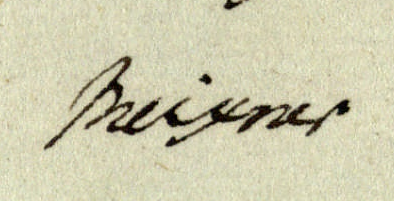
Meixner
